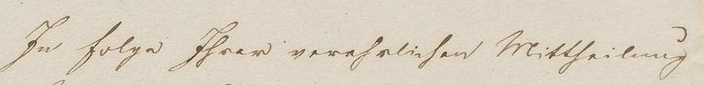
In Folge Ihrer verehrlichen Mittheilung
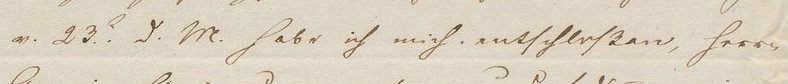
v. 23t d. M. habe ich mich entschloßen, Herrn
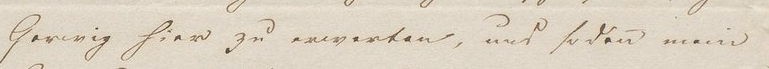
Gerwig hier zu erwarten, und sodann mein
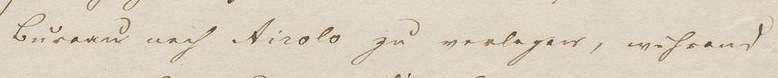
Bureau nach Airolo zu verlegen, während
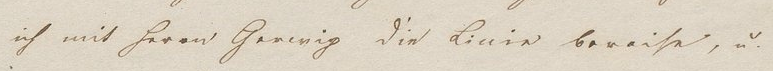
ich mit Herrn Gerwig die Linie bereise, u.
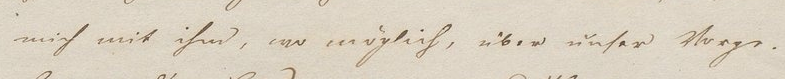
mich mit ihm, wo möglich, über unser Vorge-
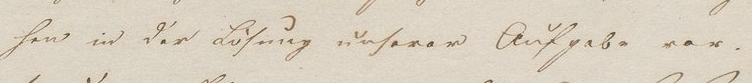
hen in der Lösung unserer Aufgabe ver-
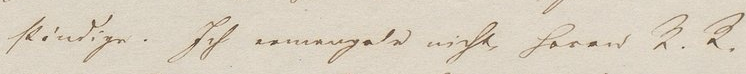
ständige. Ich ermangele nicht, Herrn R.R.
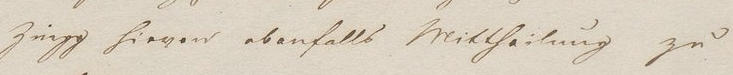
Zingg hievon ebenfalls Mittheilung zu
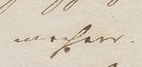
machen.
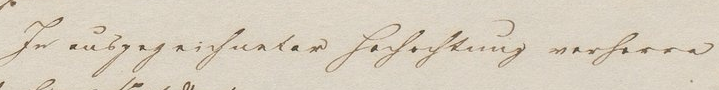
In ausgezeichneter Hochachtung verharre
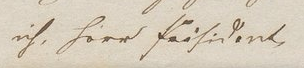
ich, Herr Präsident,
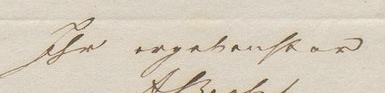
Ihr ergebenster
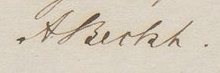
A Beckh.
